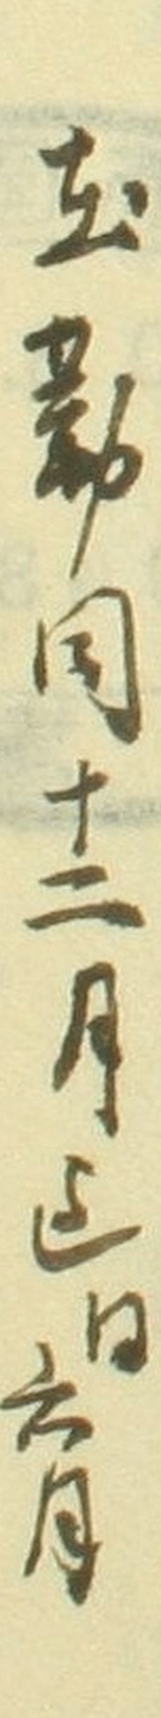在勤同十二月迠同六月
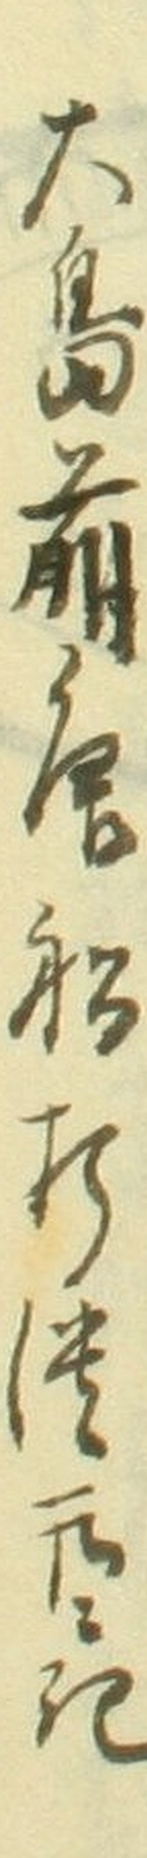大島前唐船打潰元之記

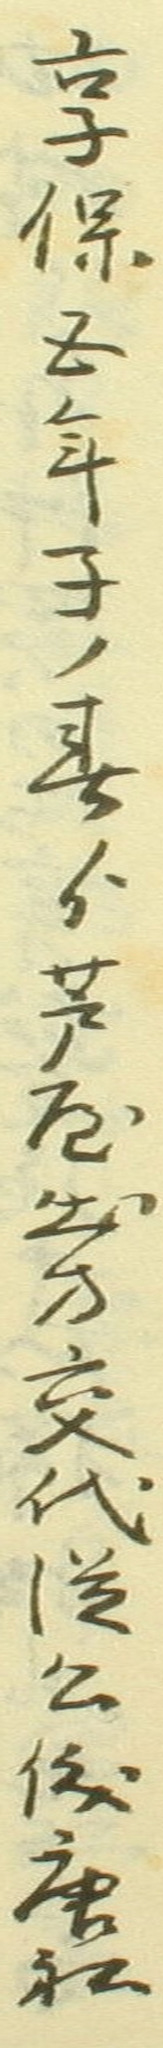享保五年子の春ゟ芦屋出方交代従公儀唐船
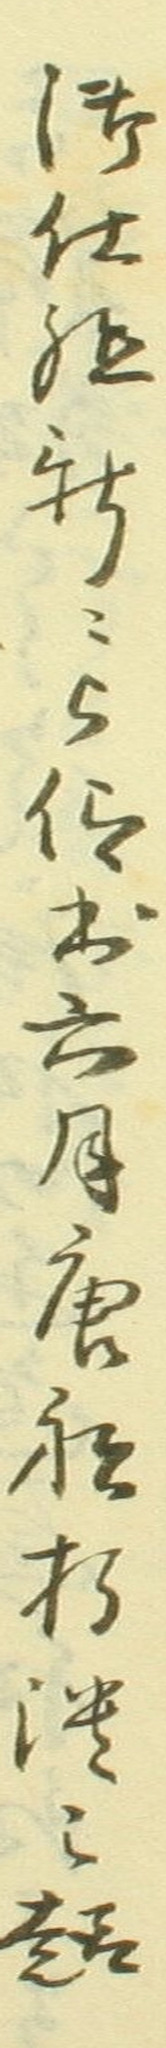御仕組新に被仰出六月唐船打漬之趣
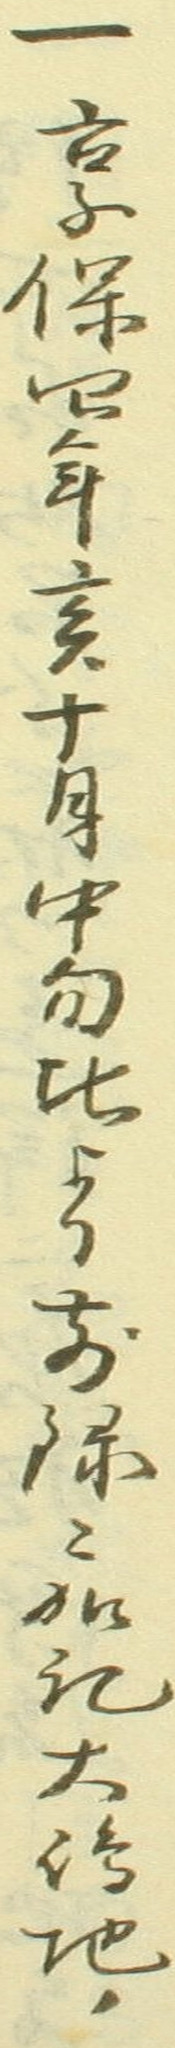一享保四年亥十月中旬頃ゟ前録之加記大伝地の
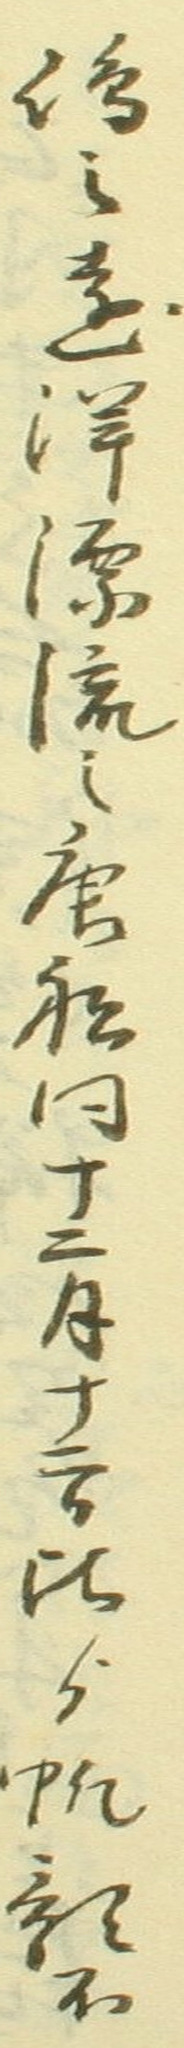伝之遠洋源流之唐船同十二月十二日頃ゟ帆影不
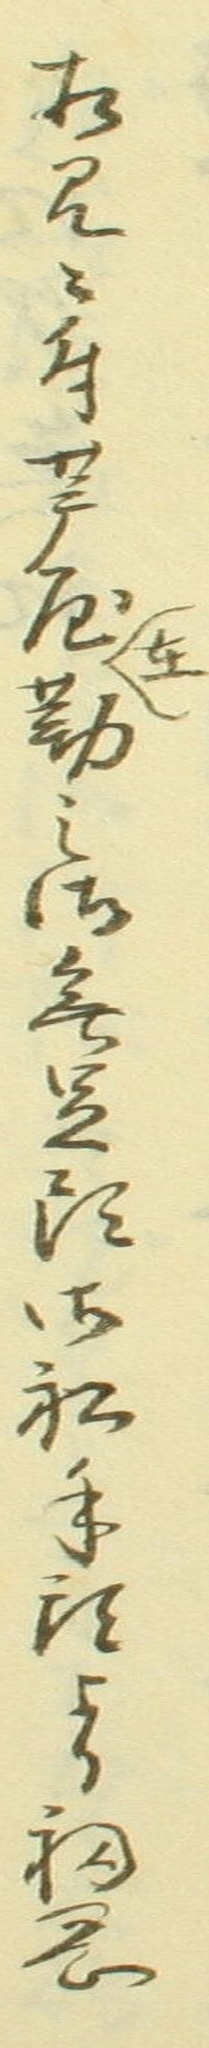相見に付芦屋在勤之御無足頭御船手頭より福岡
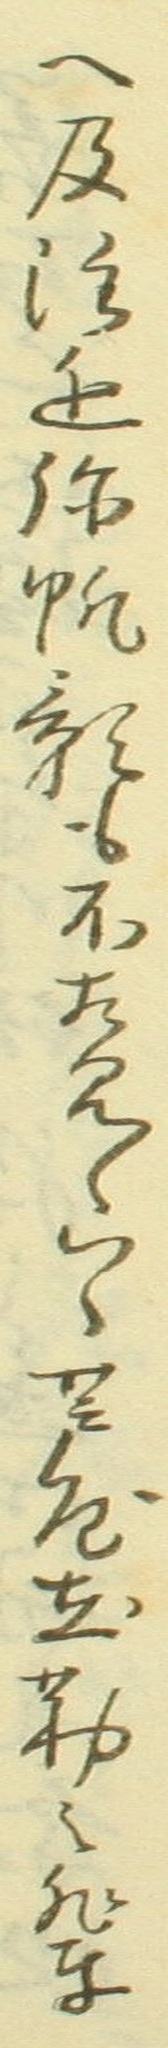へ及注進弥帆影も不相見候はゝ芦屋在勤之輩
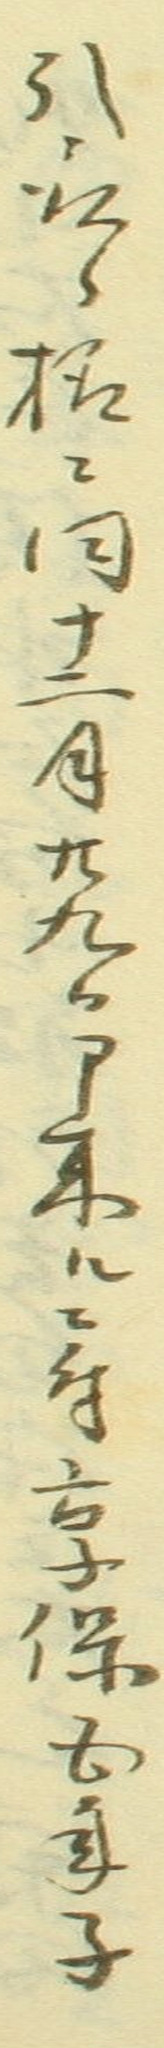引取候様に同十二月廿九日申来るに付享保五年子
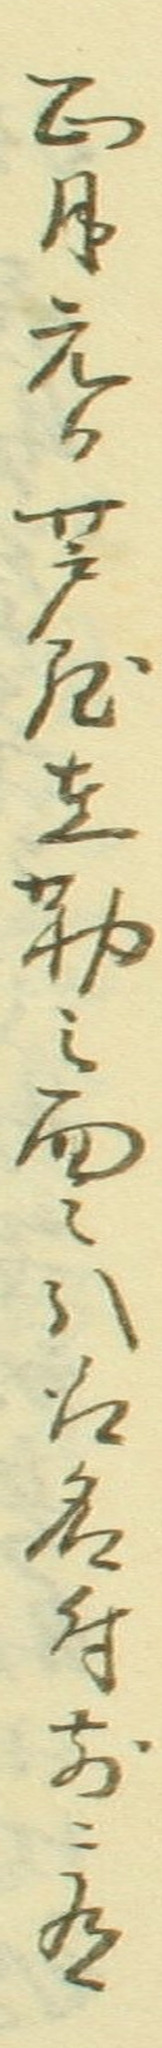正月元日芦屋在勤之面々引取名付前に有
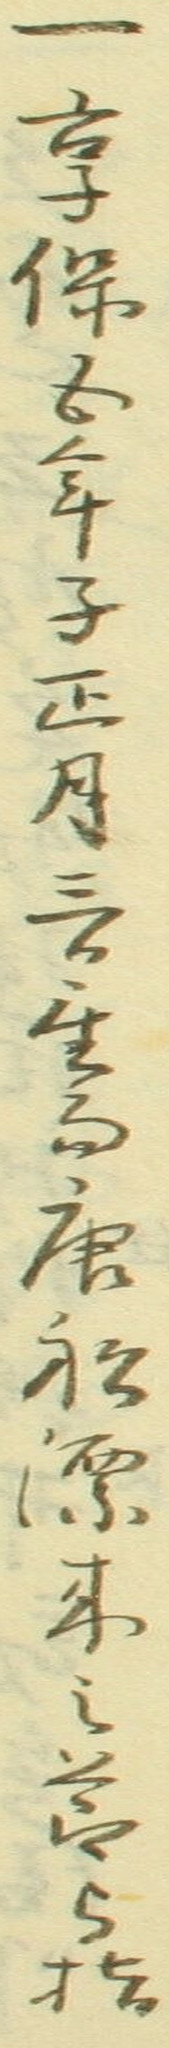一享保五年子正月三日置而唐船漂来之節被指
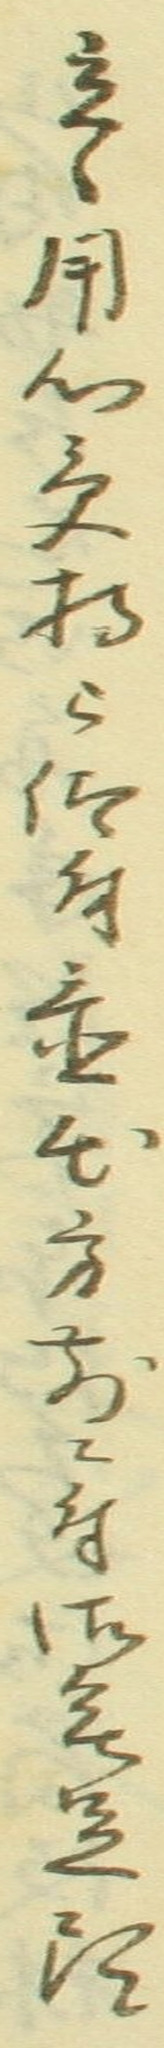立候用心受持被仰付置其方前に付御無足頭

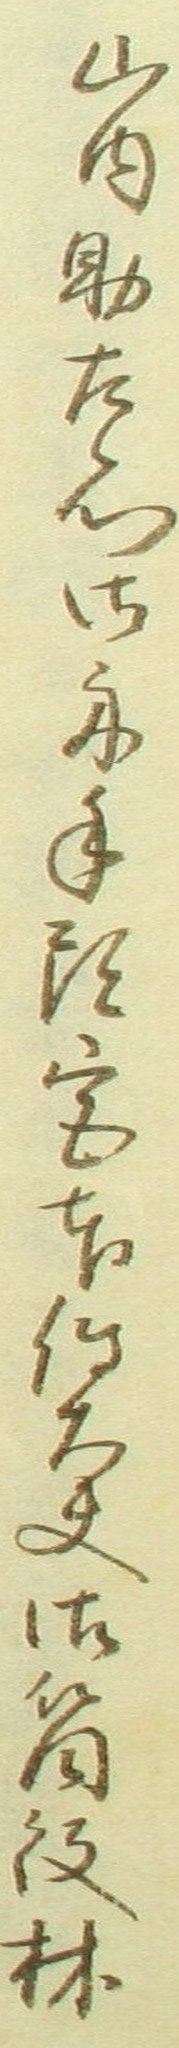山田助左衛門御舟手頭宮本伝太夫御筒役林
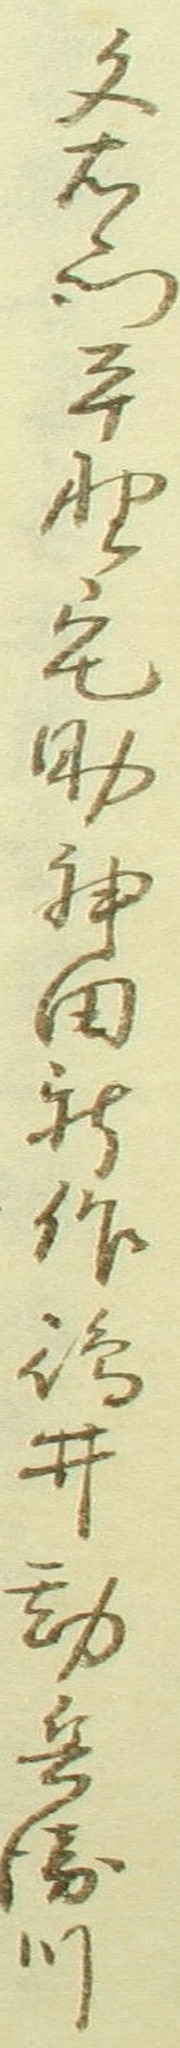文右衛門平野宅助神田新作嶋井勘兵衛川
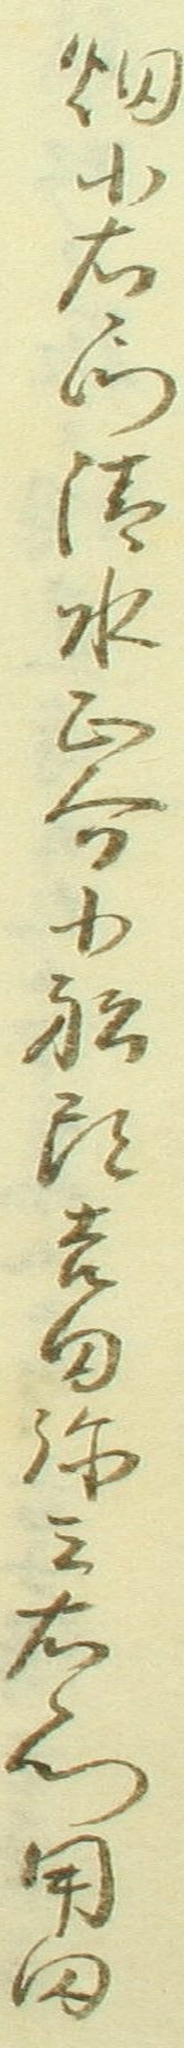畑小右衛門清水正介小船頭吉田弥之右衛門用田
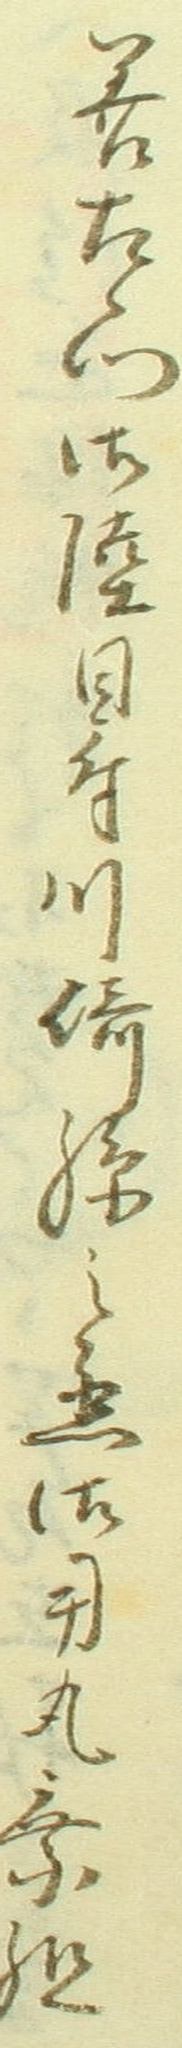善左衛門御陸目付川崎孫之丞御用丸乗組
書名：唐船漂流記 四
